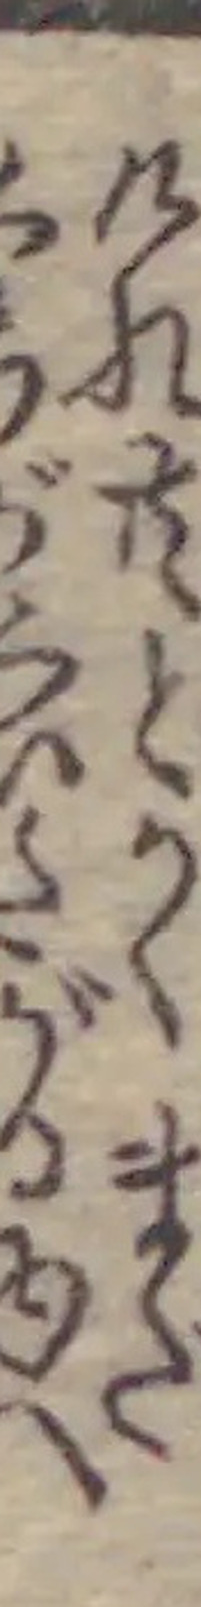くちがくいたがるゆへ
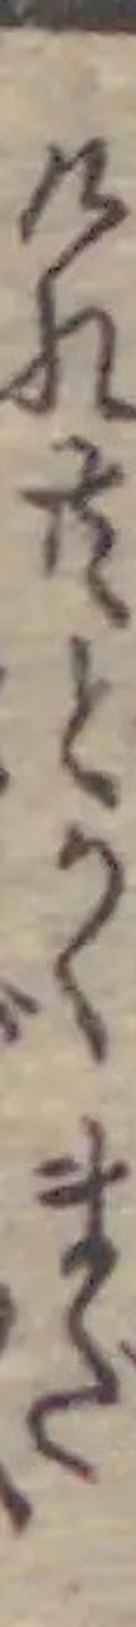けれ共とかくまだ
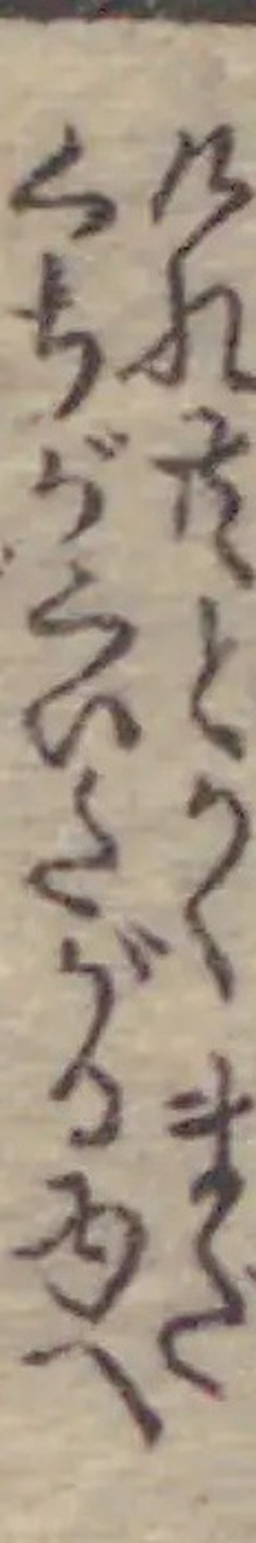くちがくいたがるゆへ
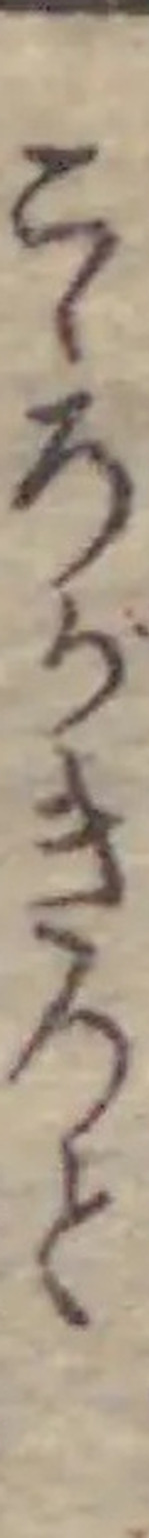こゝろがきつと
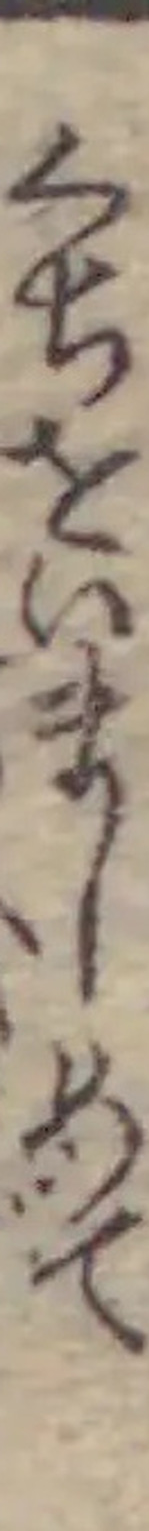くちをいましめて
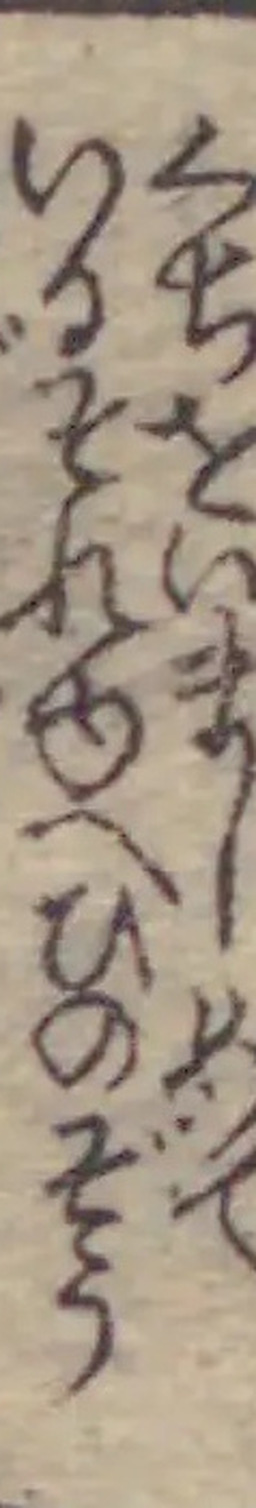いるそれゆへひのぞう
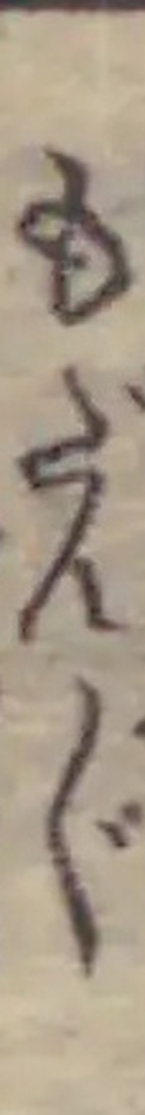もだん〴〵
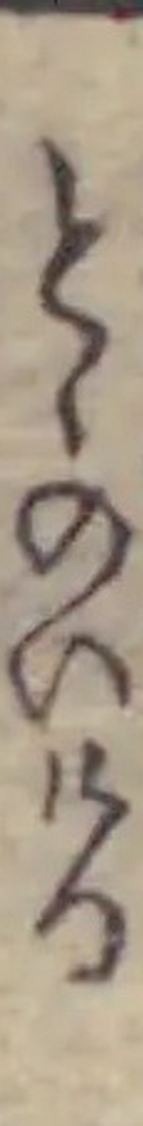とゝのいける
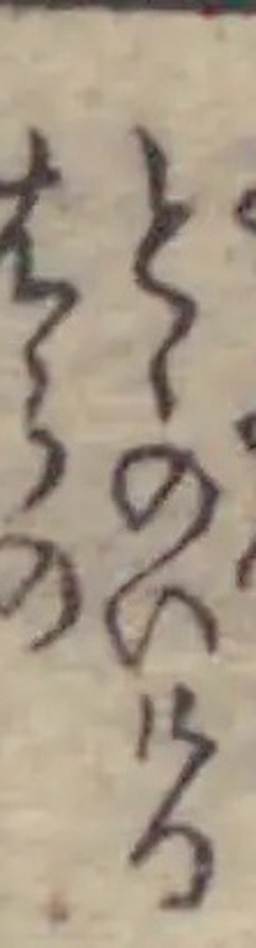はらの
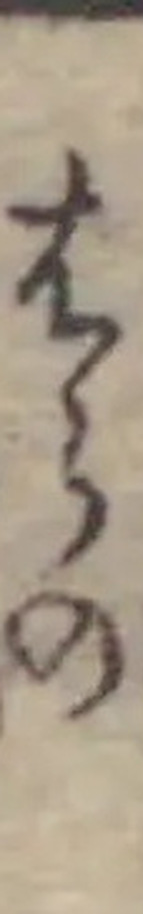はらの
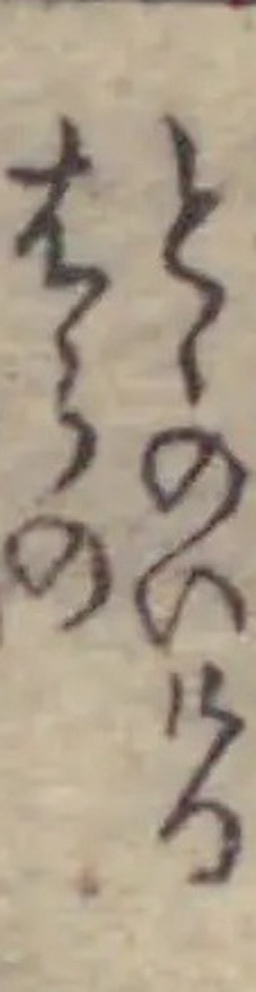はらの
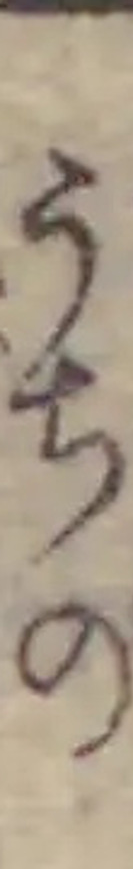うちの
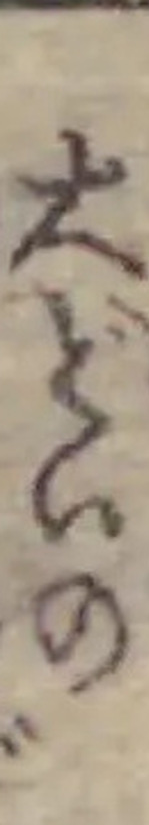大どいの
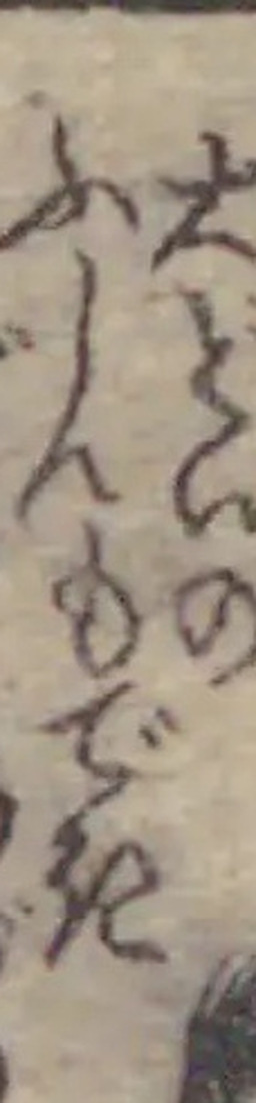ふしんもでき
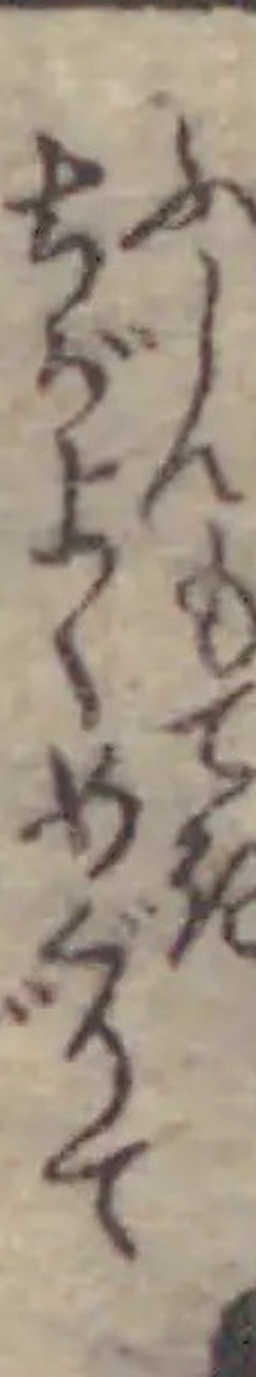ちがよくめぐりて
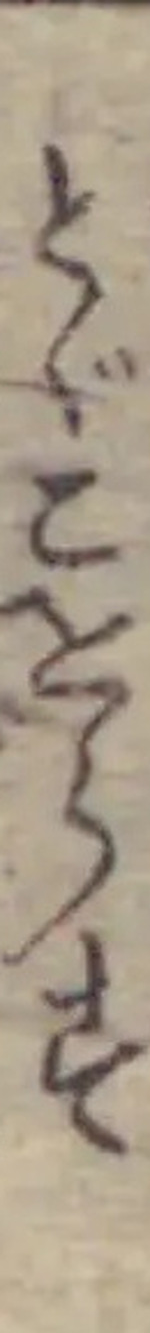とゞこをらず
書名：腹内養生主論 3巻
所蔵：国立国会図書館 National Diet Library, JAPAN
